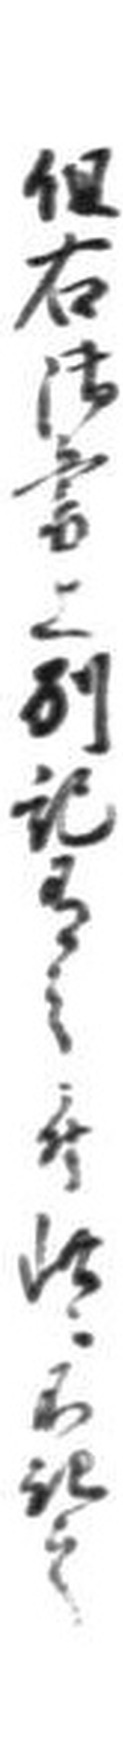但右御書上別記有之ニ付此ニ不記之
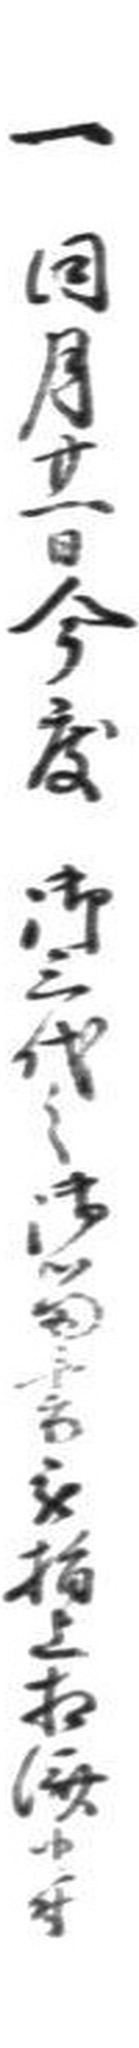一同月廿一日今度御三代之御留書被指上相済候ニ付

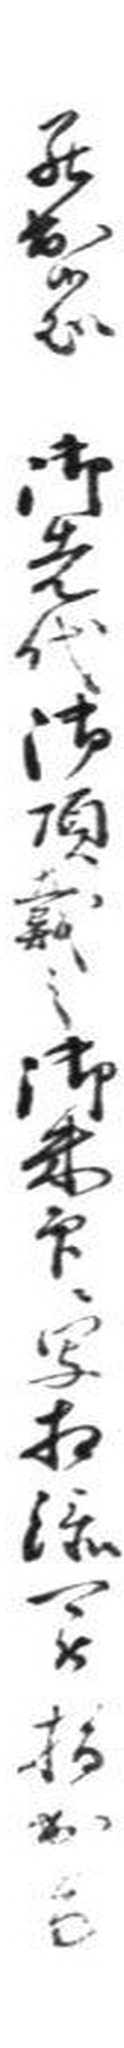罷出候処御先代御頂戴之御朱印ニ写相添可被指出旨
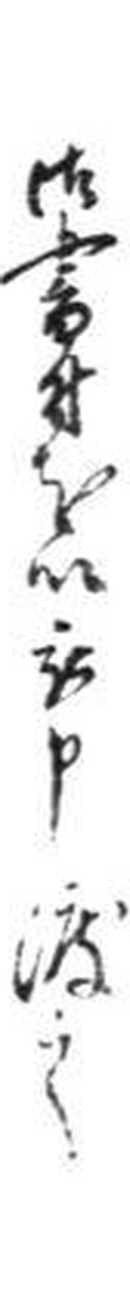御書付を以被申渡之
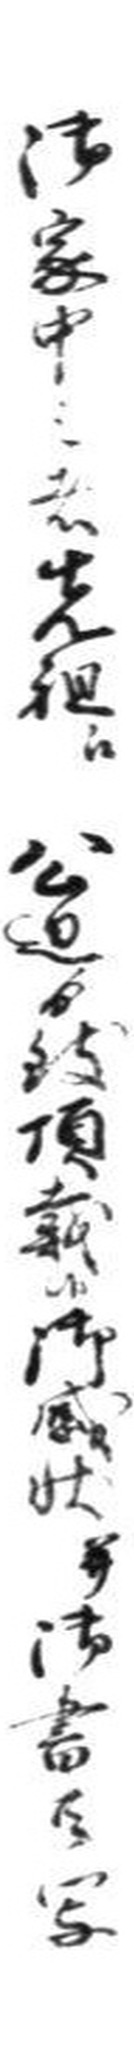御家中之者先祖江公辺ゟ致頂戴候御感状并御書共写
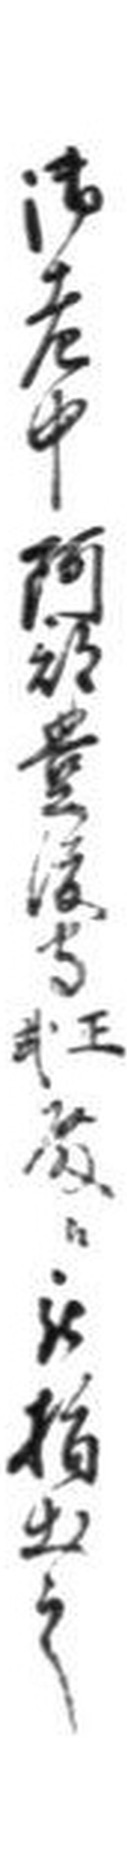御老中阿部豊後守正武殿江被指出之
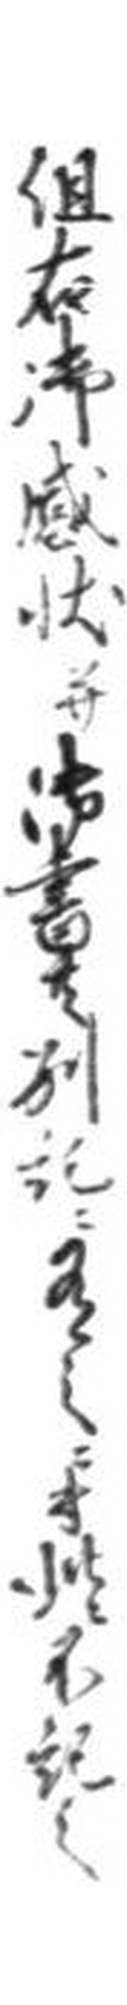但右御感状并御書共別記ニ有之ニ付此ニ不記之
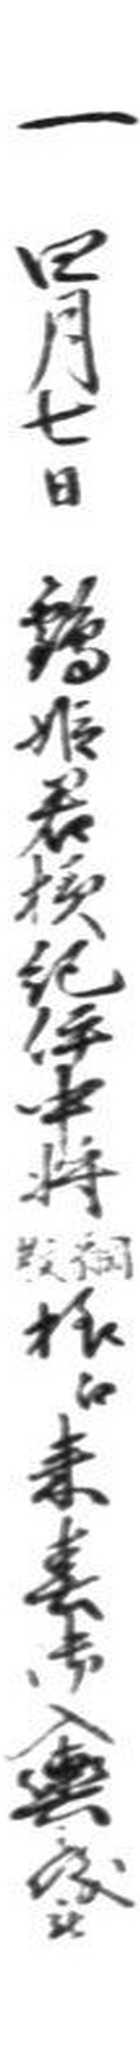一四月七日鶴姫君様紀伊中将綱教様江来春御入輿之儀被
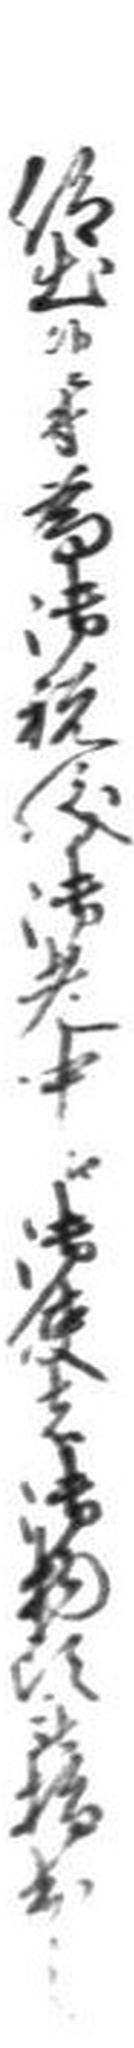仰出候ニ付為御祝儀御老中江御使者御物頭被指出之
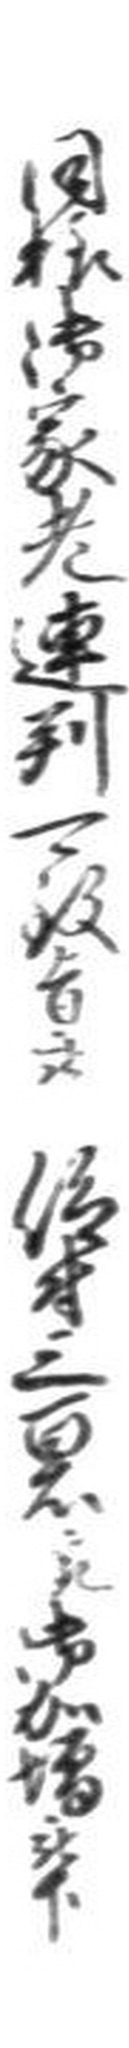同様御家老連判可致旨被仰付三百石ニ宛御加増被下
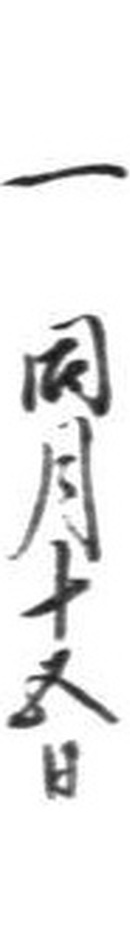一同月十五日
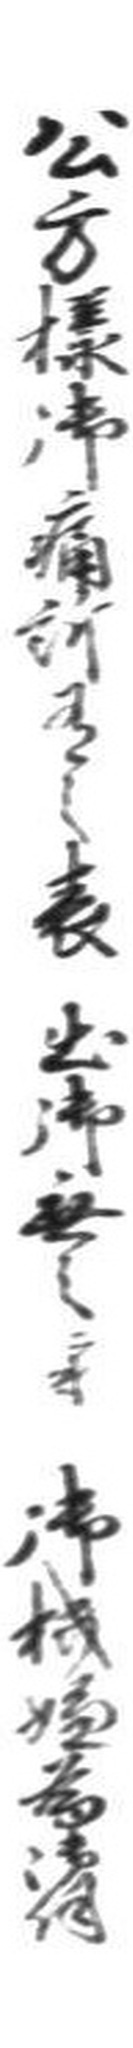公方様御痛所有之表出御無之ニ付御機嫌為御伺
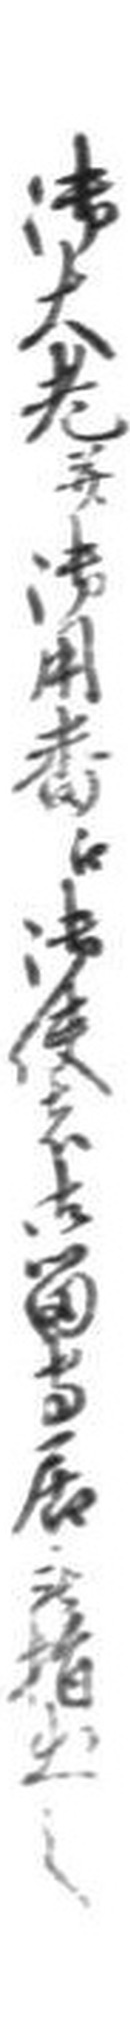御大老并御用番江御使者御留守居被指出之
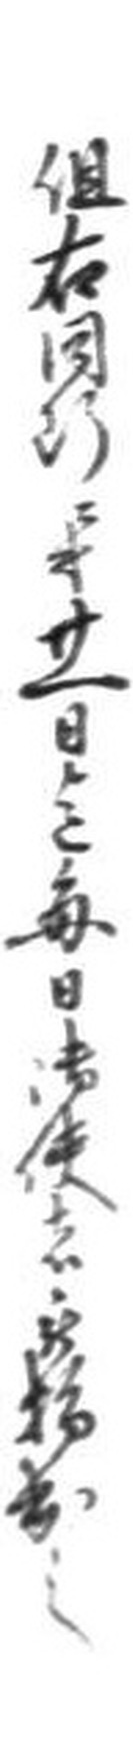但右同断ニ付廿一日迄毎日御使者被指出之

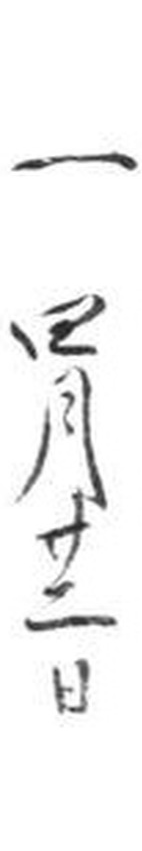一四月廿二日
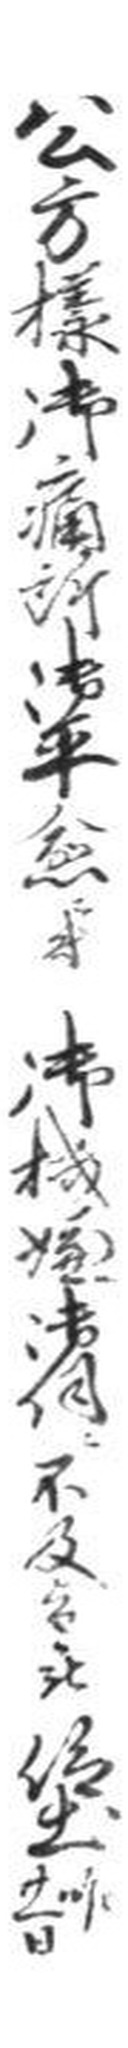公方様御痛所御平愈ニ付御機嫌御伺ニ不及旨被仰出昨廿一日
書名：家譜 十五 綱昌公 従天和元年到元禄十二年
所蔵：福井県文書館 Fukui Prefectural Archives
